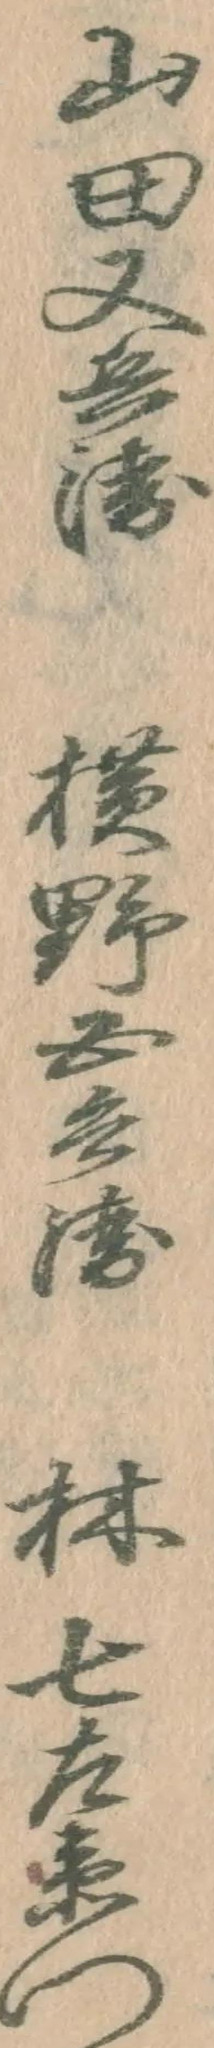山田又兵衛横野五兵衛林七左衛門
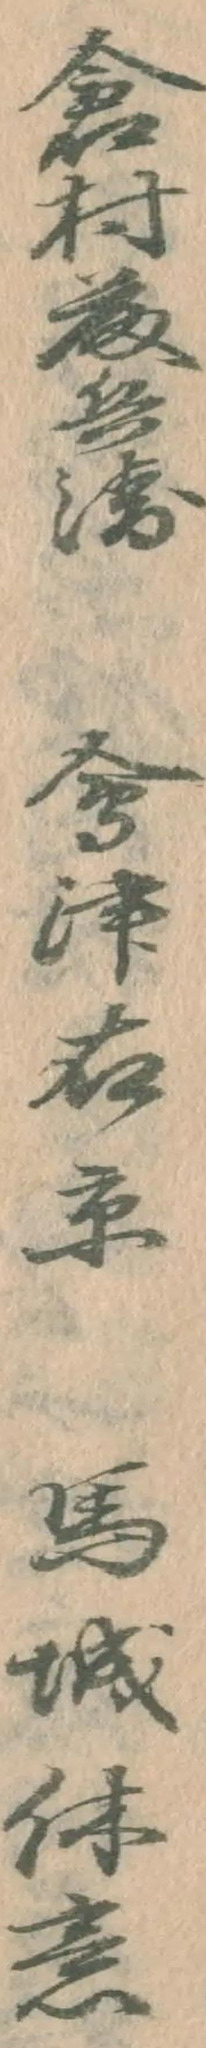倉村藤兵衛会津右京馬城休意
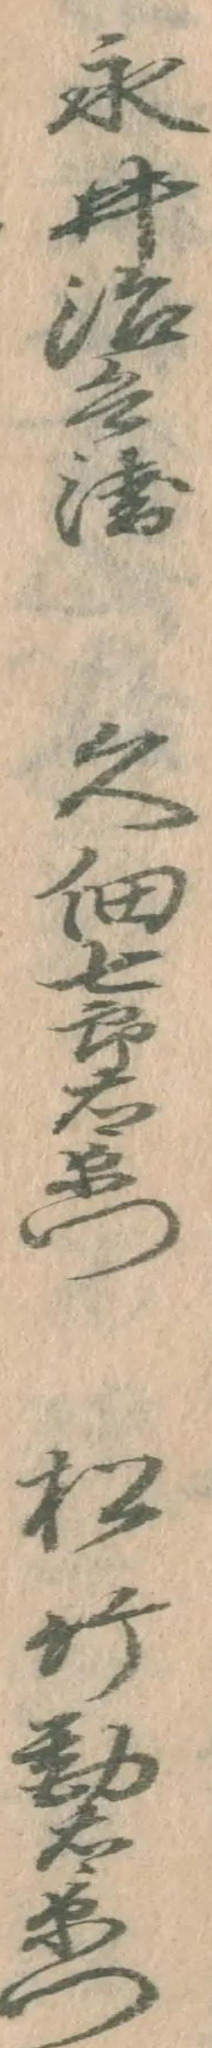永井治兵衛久佃七郎右衛門松竹勘右衛門
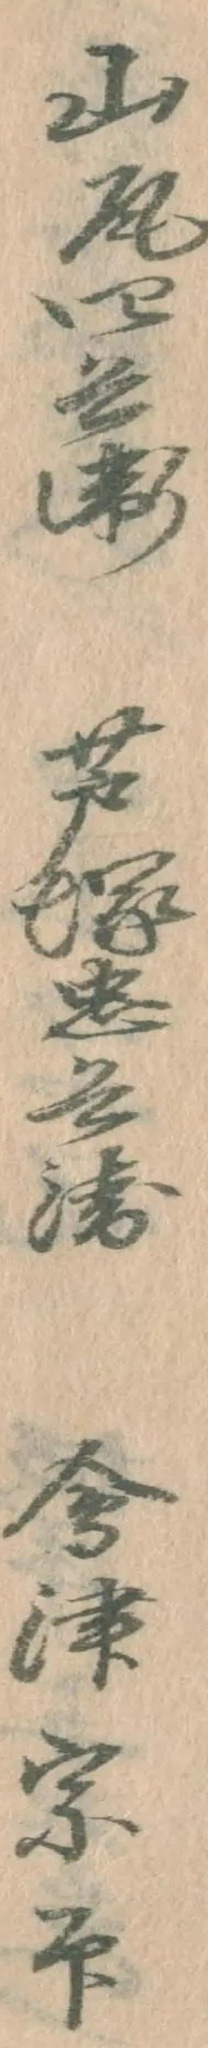山尾四兵衛芦塚忠兵衛会津宗印
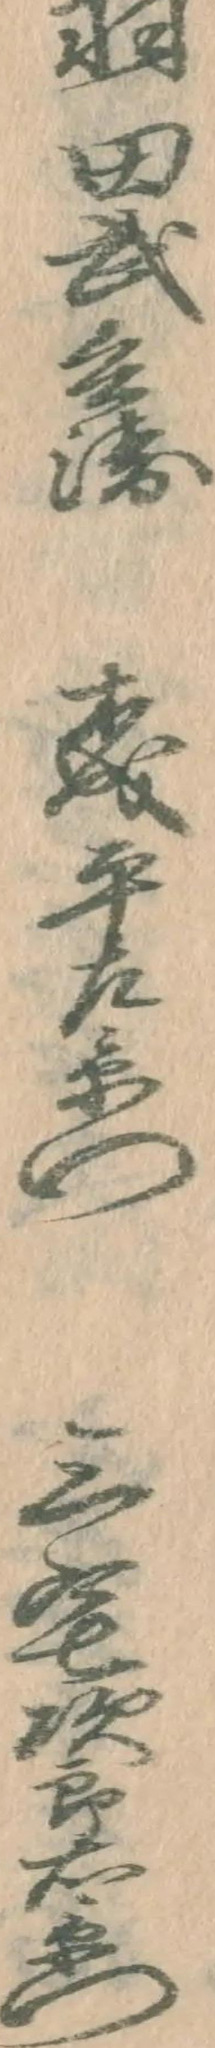羽田武兵衛森平左衛門三宅次郎右衛門
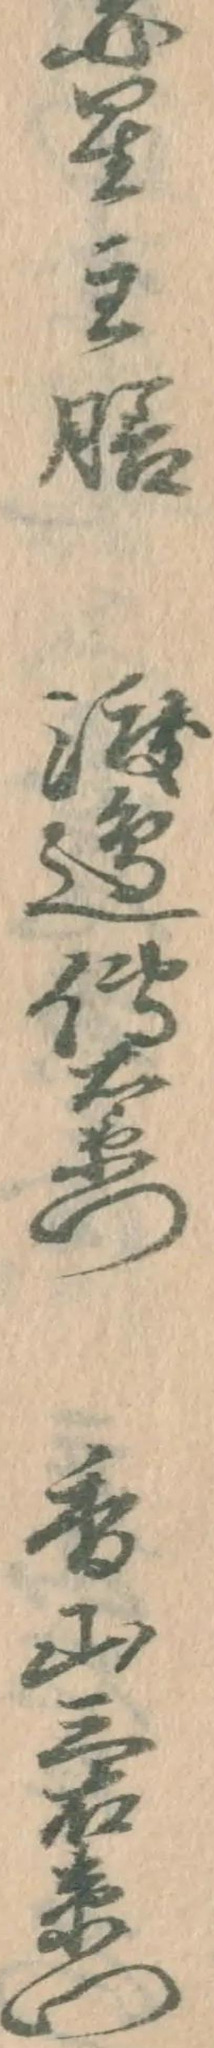赤星主膳渡辺伝右衛門香山三右衛門

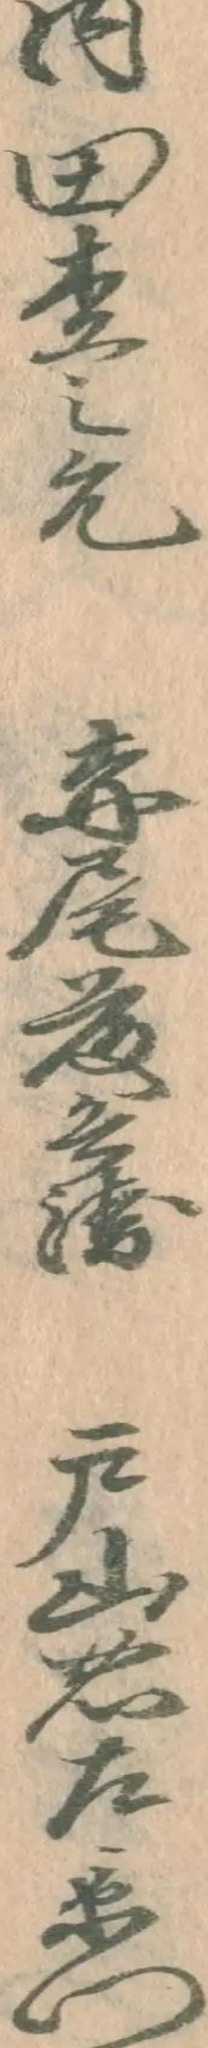内田杢之允赤尾藤兵衛戸山忠左衛門
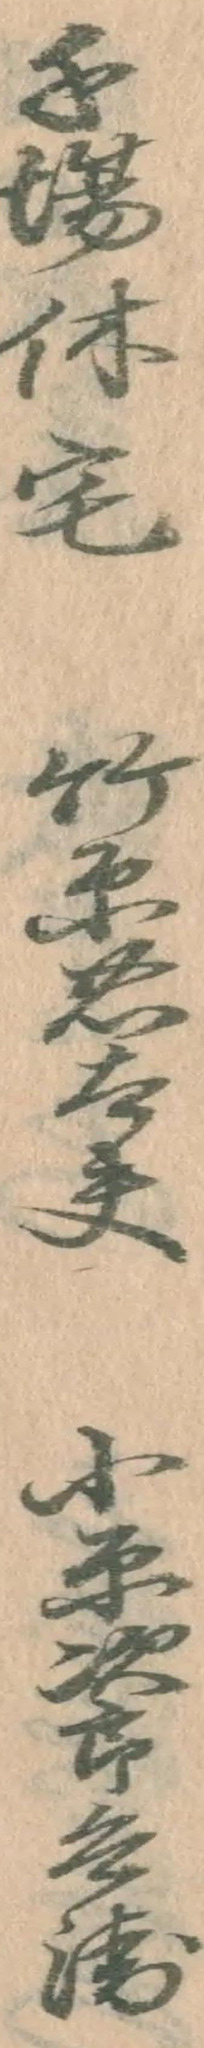千場休宅竹原忠太夫小原次郎兵衛
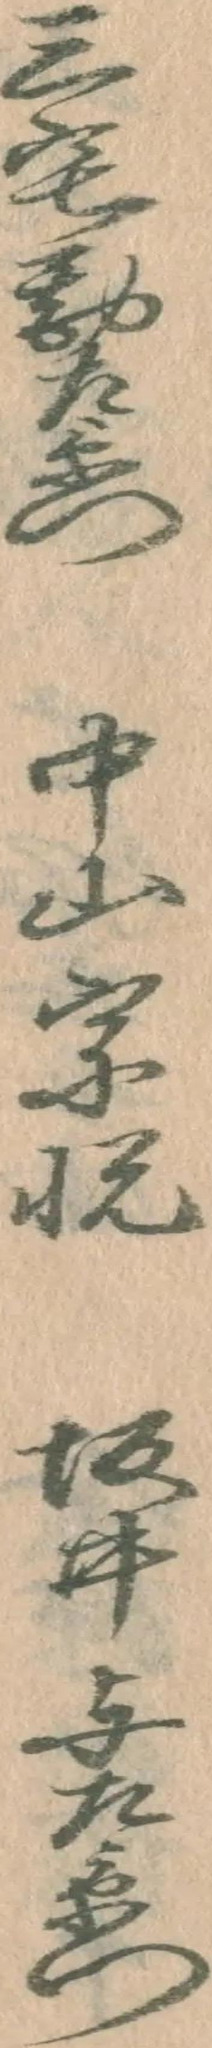三宅勘左衛門中山宗悦坂井与左衛門
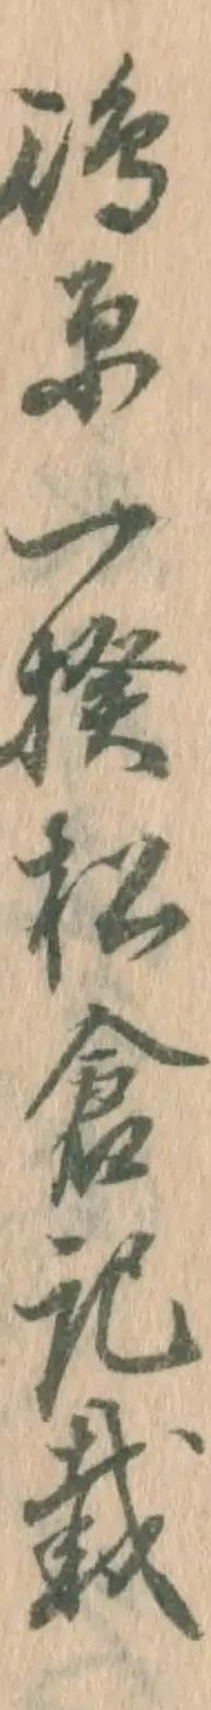島原一揆松倉記載
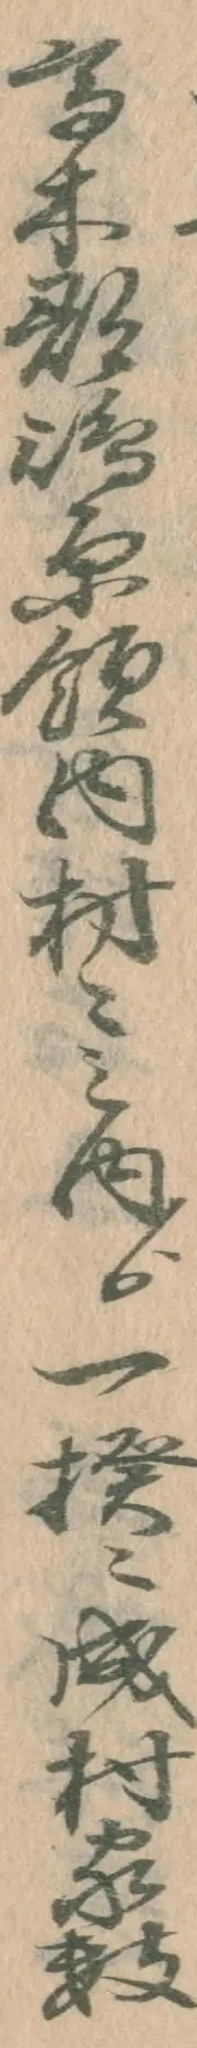高木郡島原領内村々之内ゟ一揆に成村家数
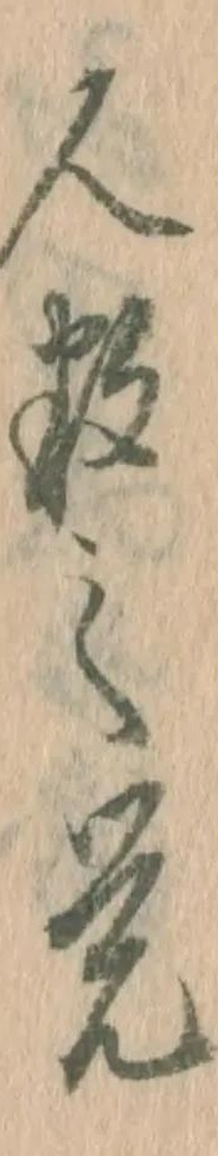人数之覚
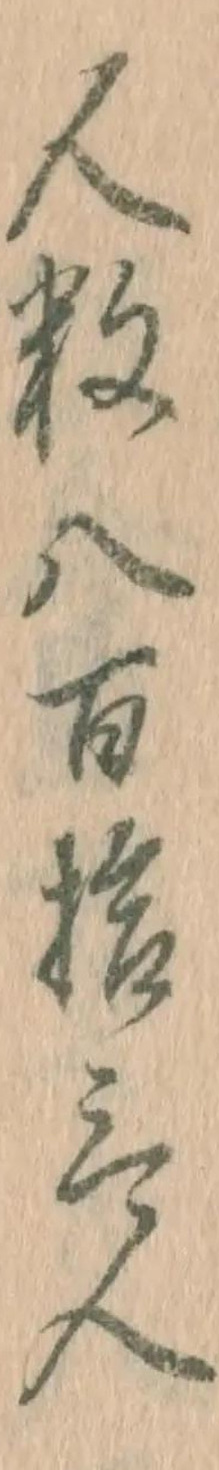人数千百三人
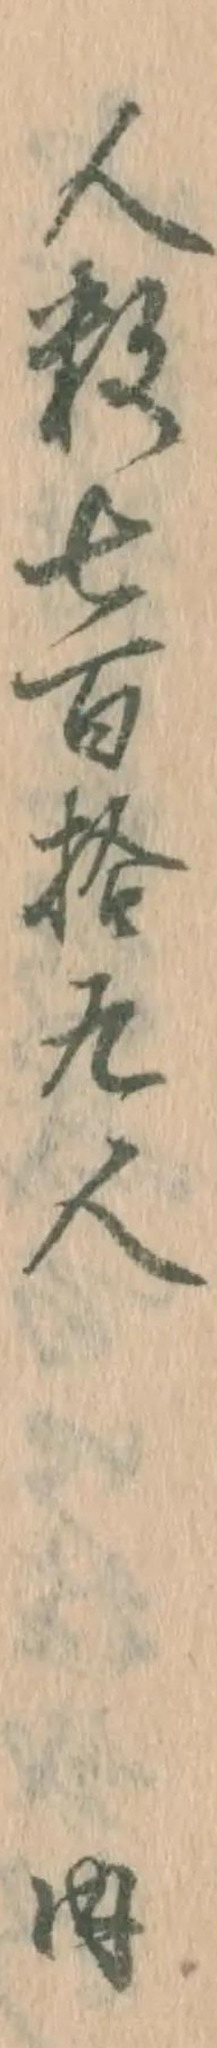人数八百六拾人同
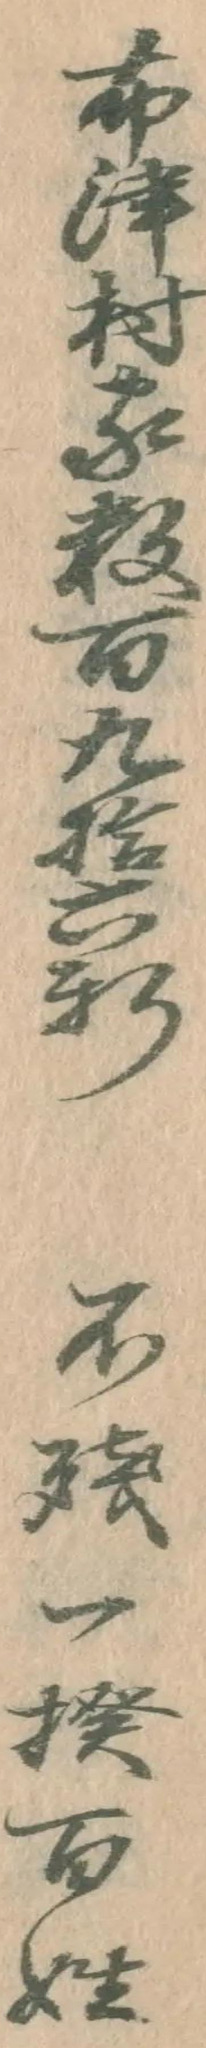布津村家数百九拾六軒不残一揆百姓
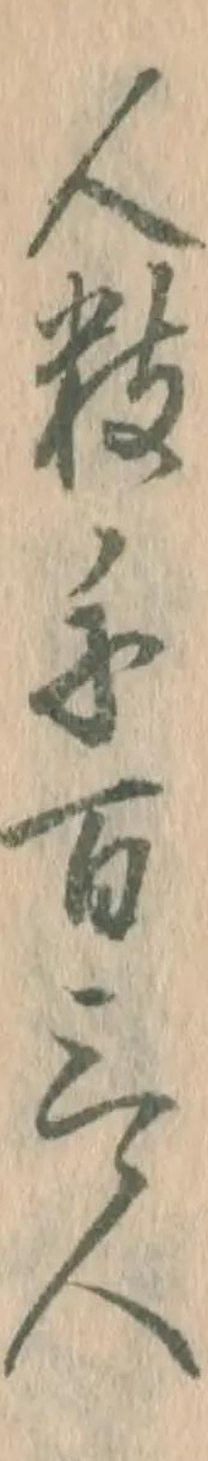人数千百三人
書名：切支丹御退治記 49巻. [4]
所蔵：国立国会図書館 National Diet Library, JAPAN
